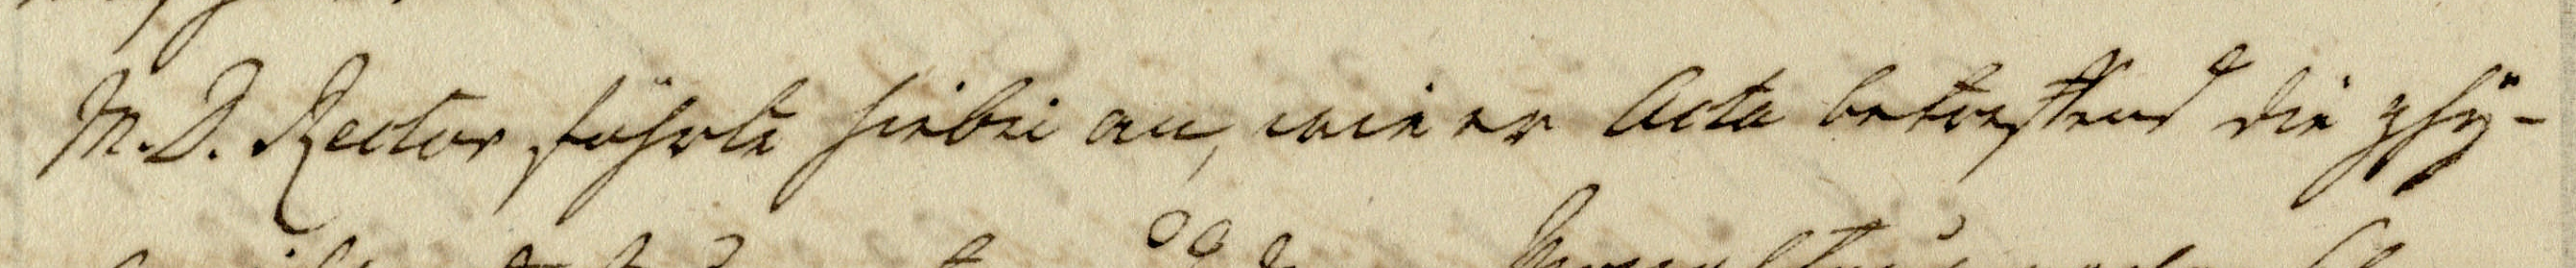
M. D. Rector führte hiebei an, wie er Acta betreffend die phÿ-
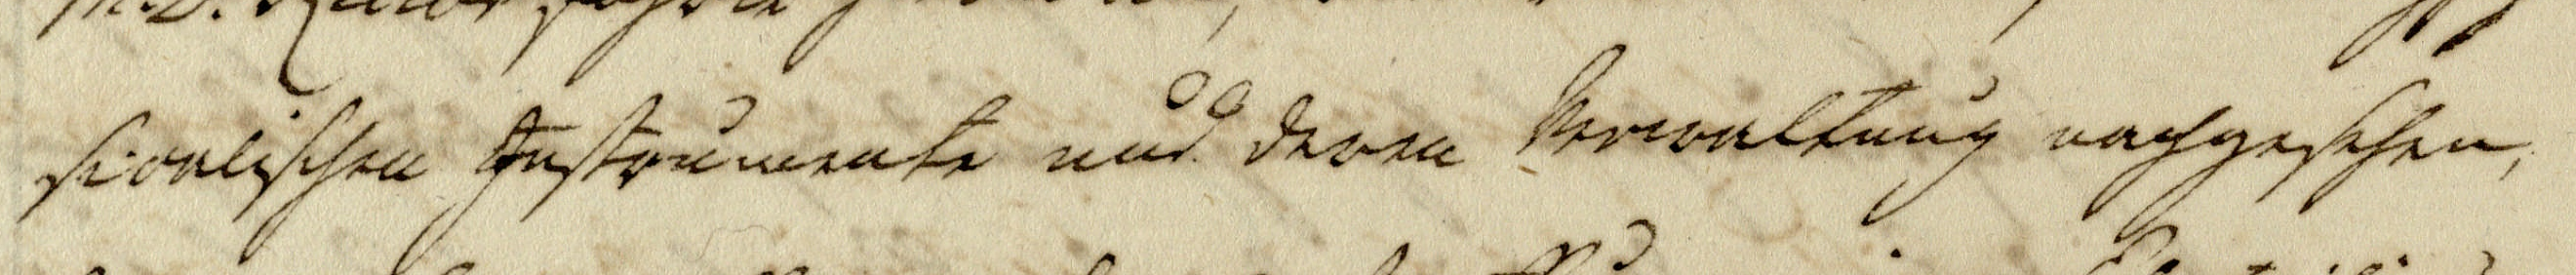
sicalischen Instrumente und deren Verwaltung nachgesehen,
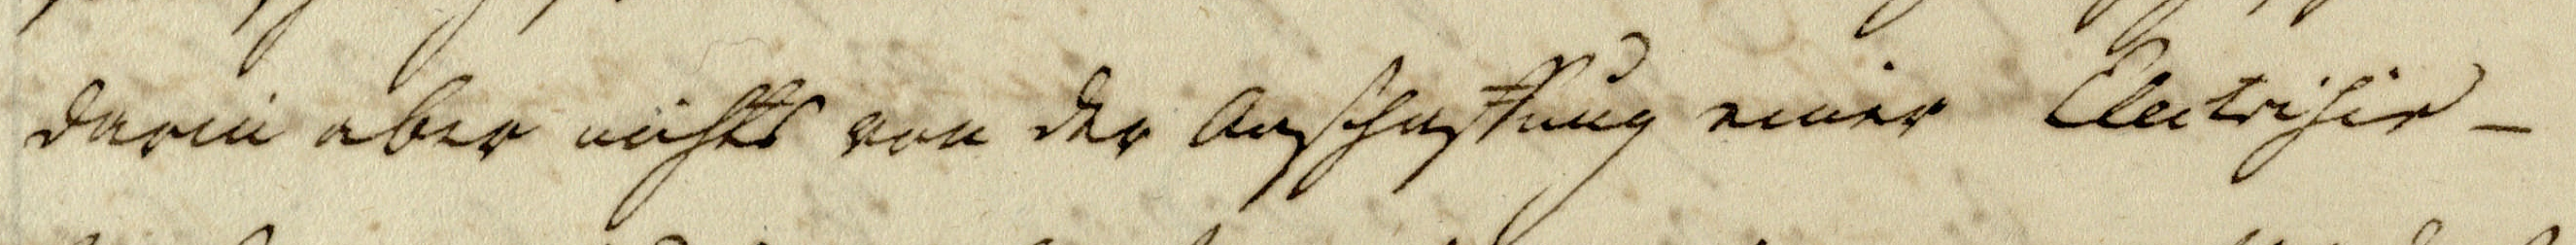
darin aber nichts von der Anschaffung einer Electrisir-
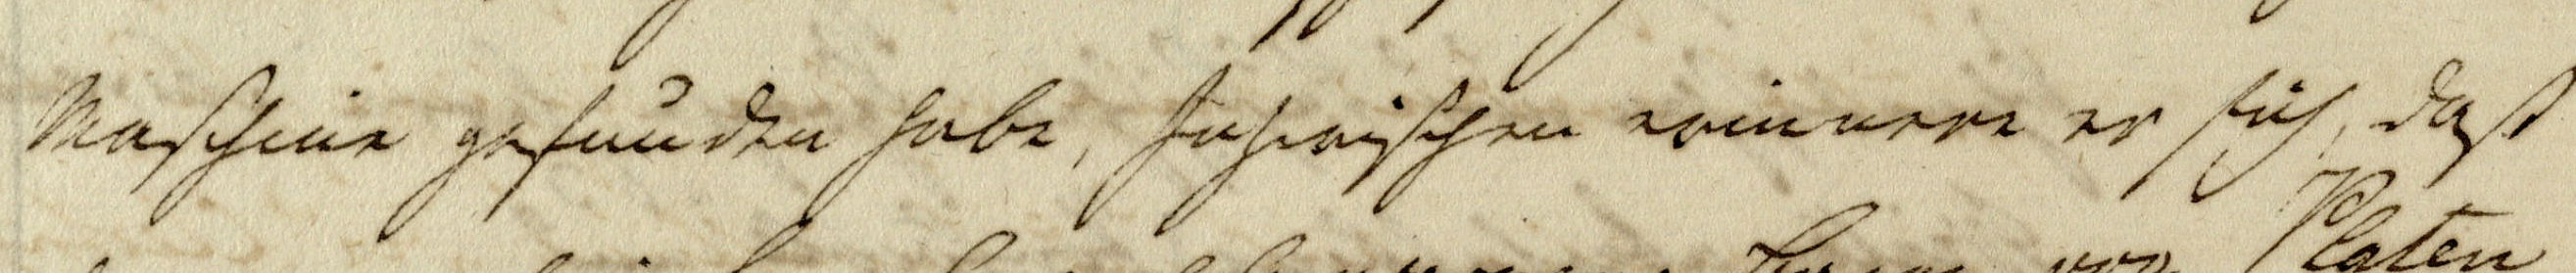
Maschine gefunden habe, Inzwischen erinnere er sich, daß
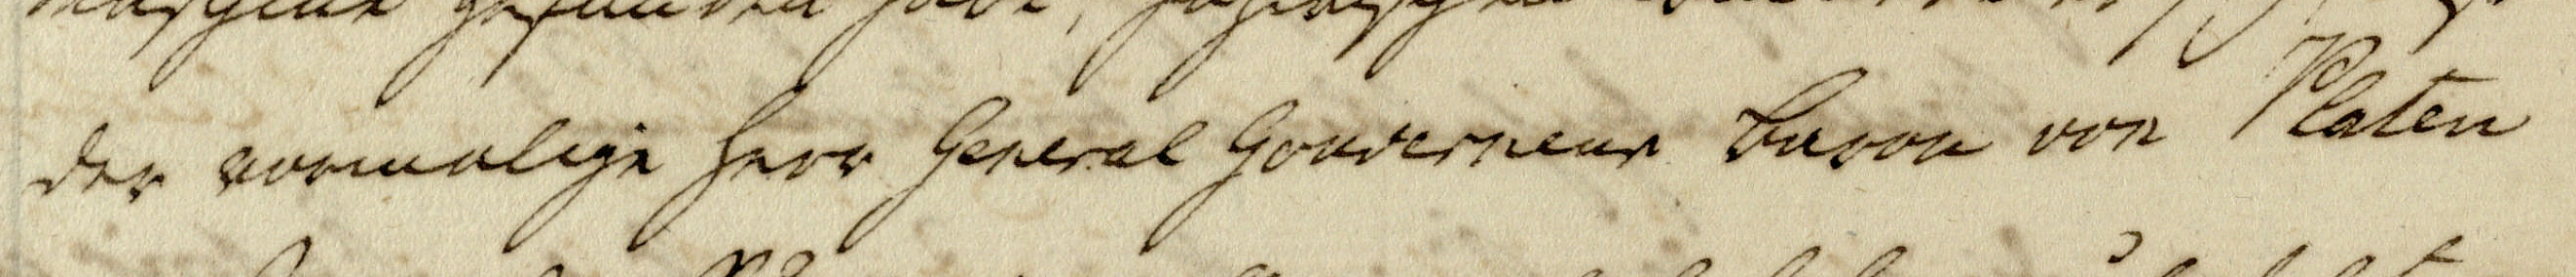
der vormalige Herr General Gouverneur Baron von Platen
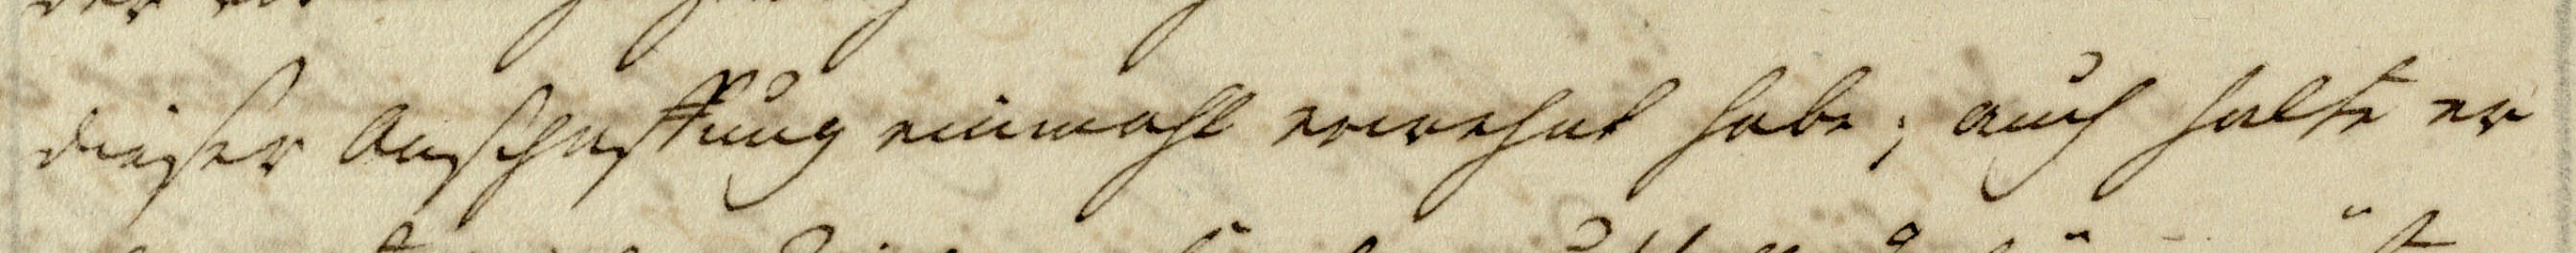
dieser Anschaffung einmahl erwehnt habe; auch halte er
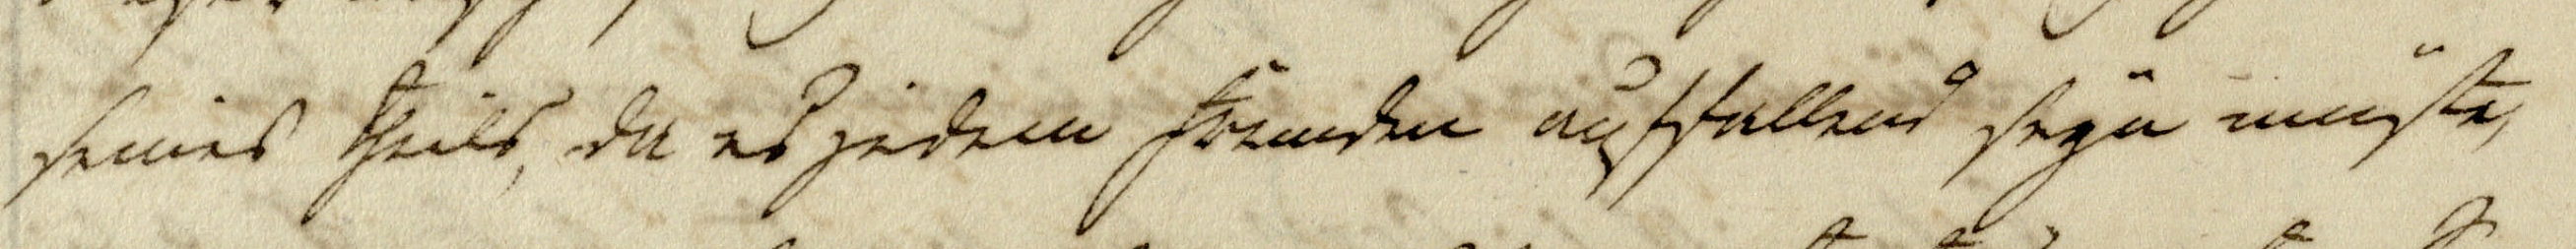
seines Theils, da es jedem Fremden auffallend seÿn müßte,
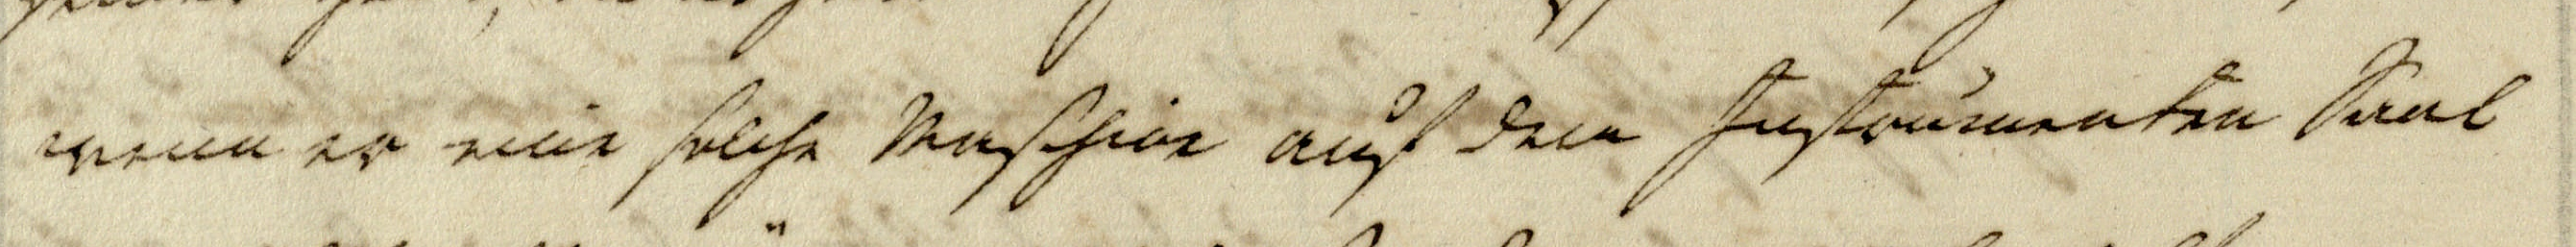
wenn er eine solche Maschine auf dem Instrumenten Saal
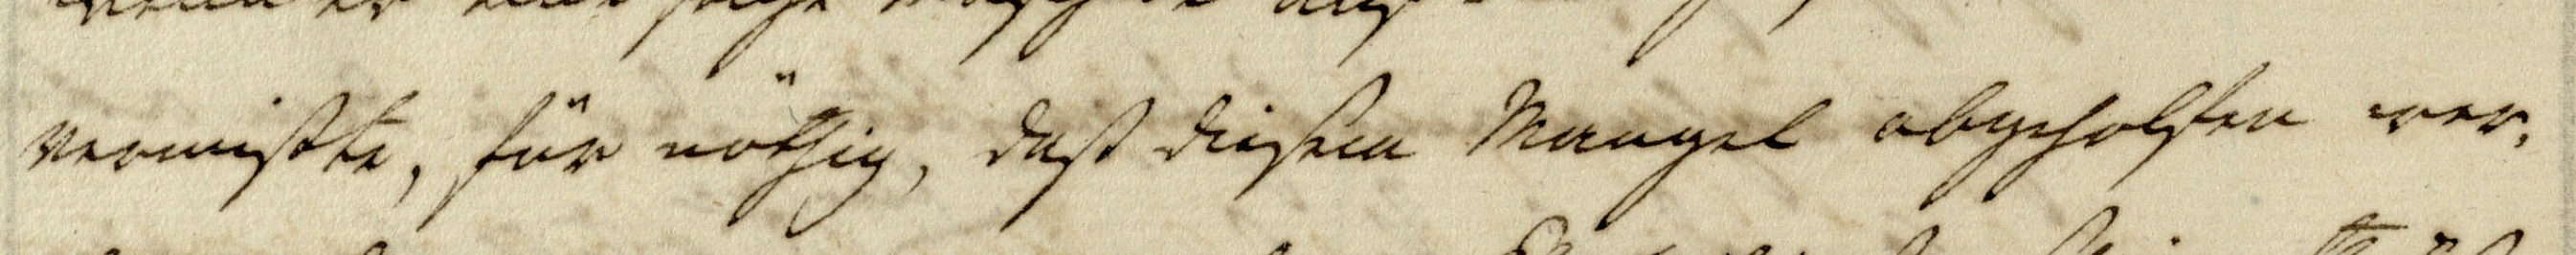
vermißte, für nöthig, daß diesem Mangel abgeholfen wer¬
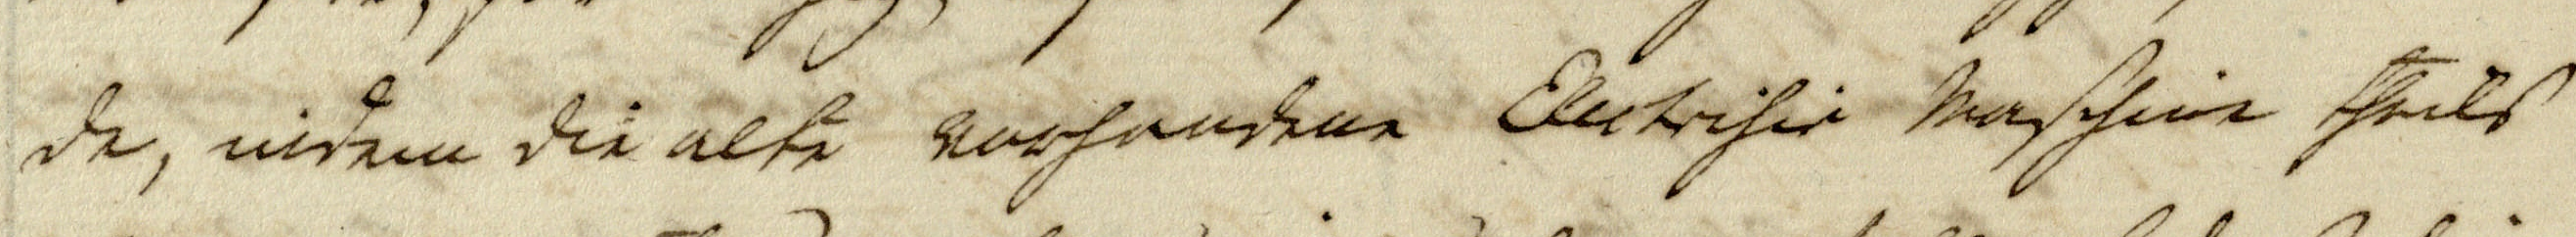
de, indem die alte vorhandene Electrisir Maschine theils
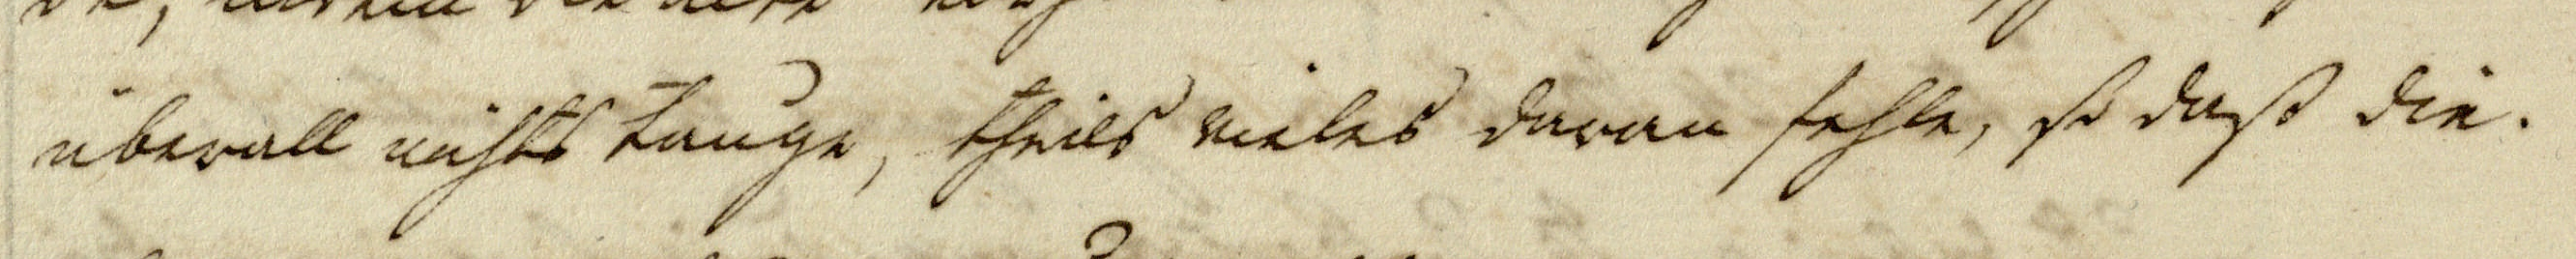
überall nichts tauge, theils vieles daran fehle, so daß die¬
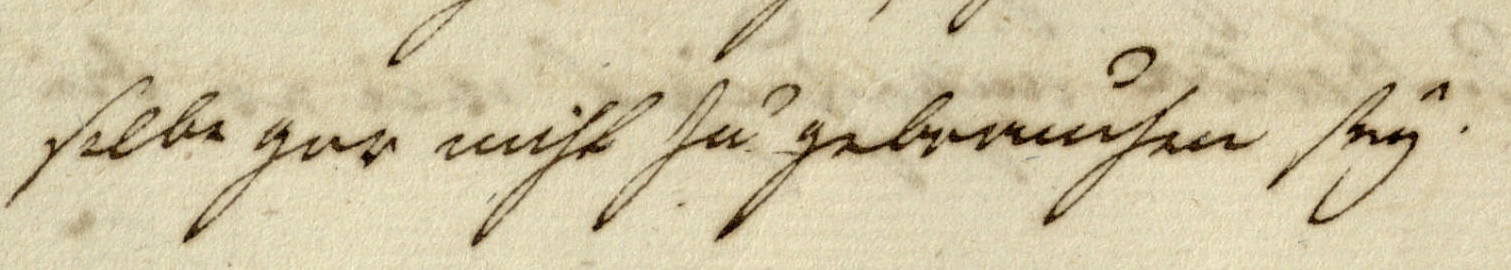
selbe gar nicht zu gebrauchen seÿ.
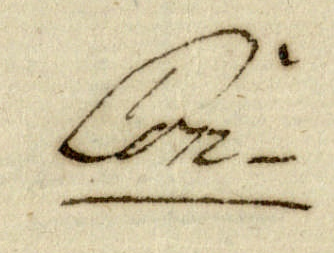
Con¬
